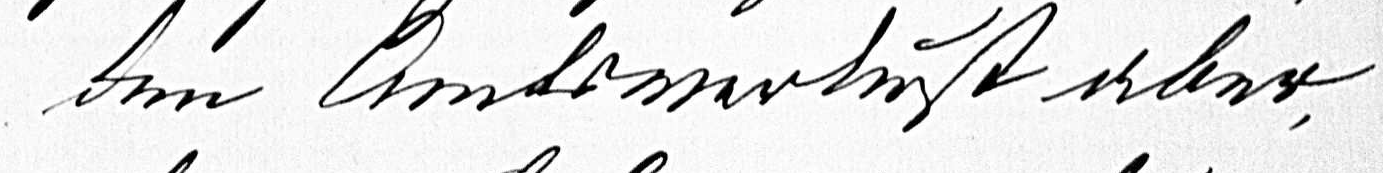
den Amtsverlust aber,
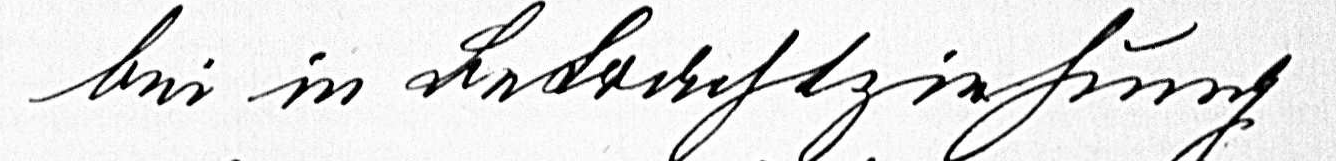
bei in Betrachtziehung
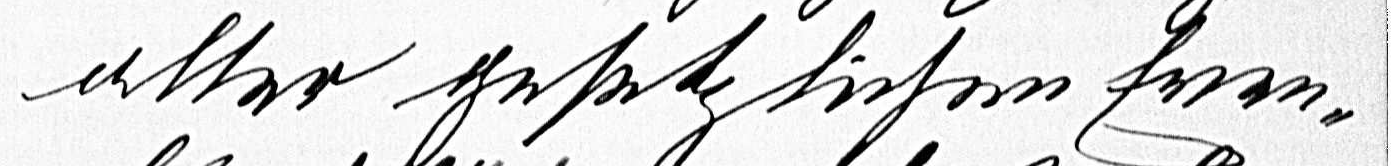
aller gesetzlichen Even¬
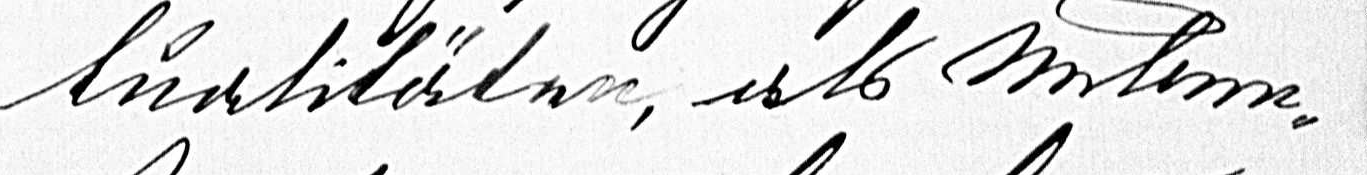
tualitäten, als Neben¬
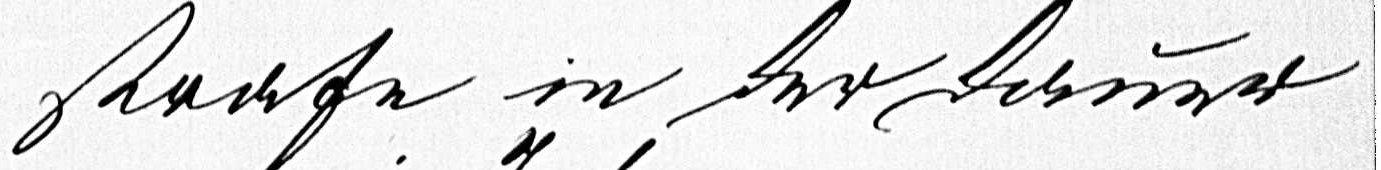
strafe in der Dauer
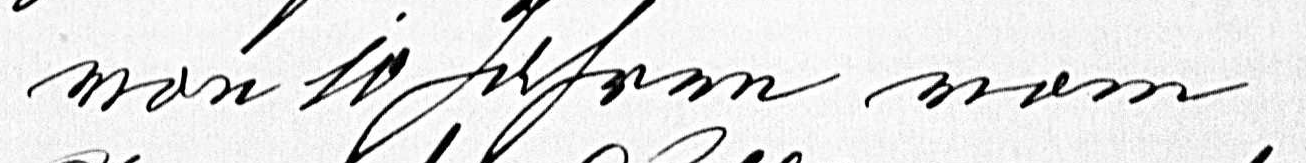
von 10 Jahren vom
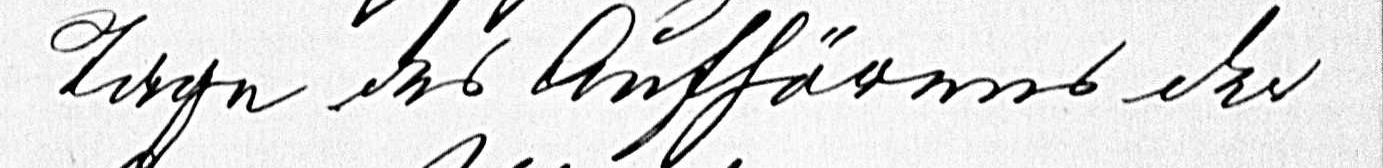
Tage des Aufhörens der
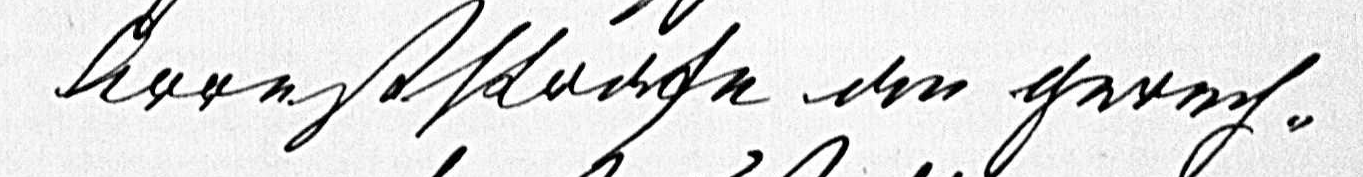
Arreststrafe am gerech¬
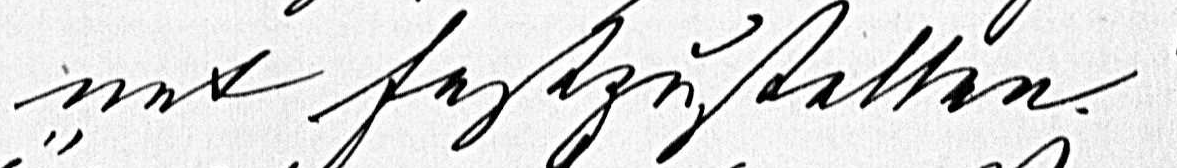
net festzustellen.
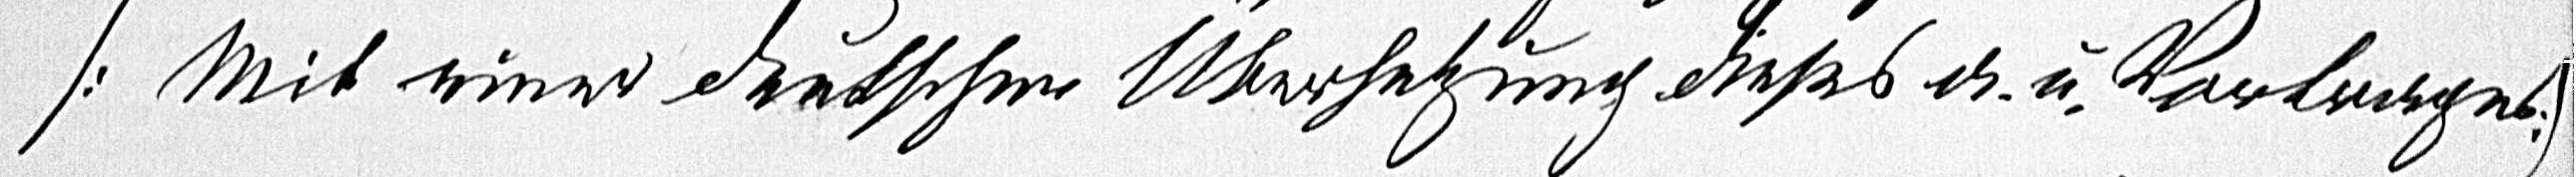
(Mit einer deutschen Übersetzung dieses a.u. Vortrages)
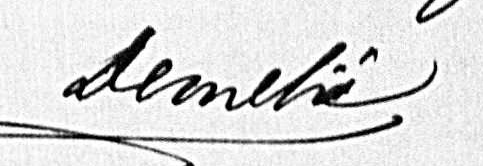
Demetić
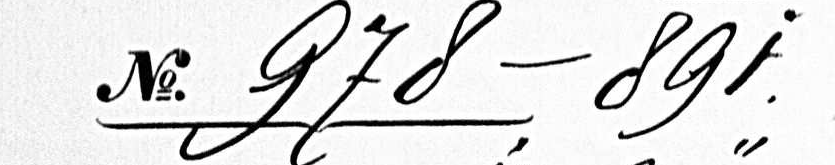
No. 978– 1891
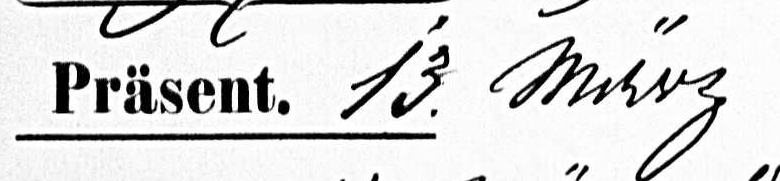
Präsent. 13. März
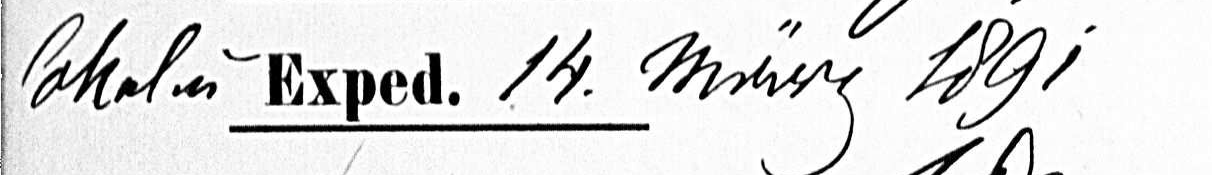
Comal u. Expedit 14/2/1891
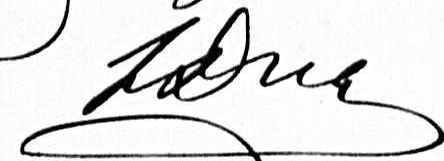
[sign]
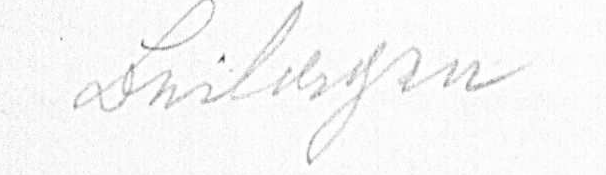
Beilagen
